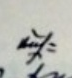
auf-
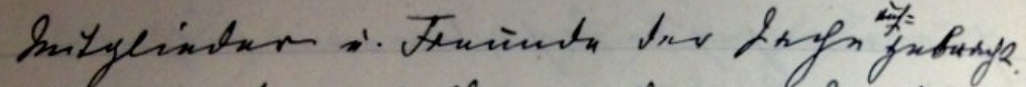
Mitglieder u. Freunde der Sache gebracht.
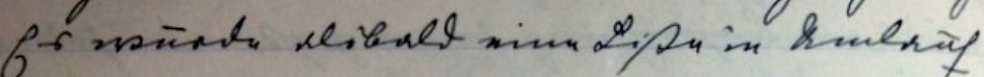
Es wurde alsbald eine Liste in Umlauf
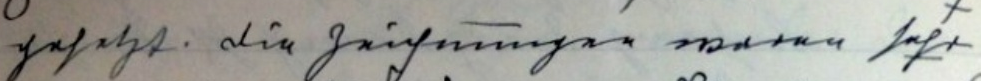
Umlauf gesetzt. Die Zeichnungen waren sehr
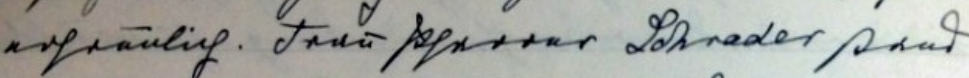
erfreulich. Frau Pfarrer Schrader stand
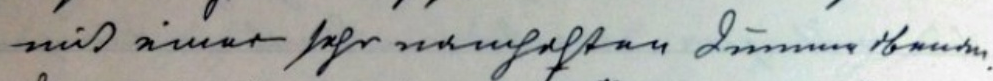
mit einer sehr namhaften Summe obenan.
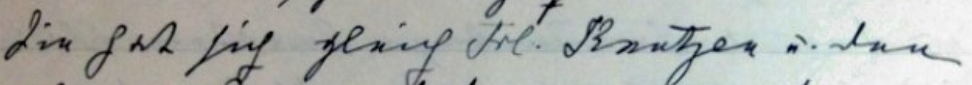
Sie hat sich gleich Frl. Knutzen u. den
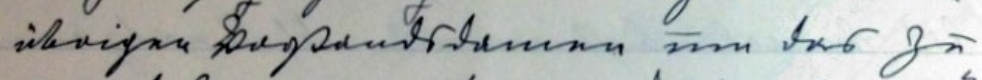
übrigen Vorstandsdamen um das zu
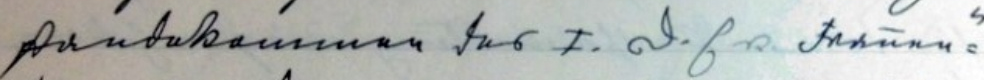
zustandekommen des I. D. Ev. Frauen
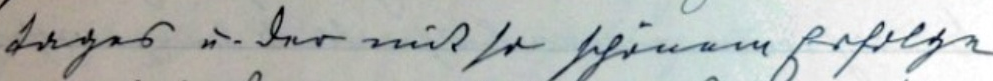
tages u. der mit so schönem Erfolge
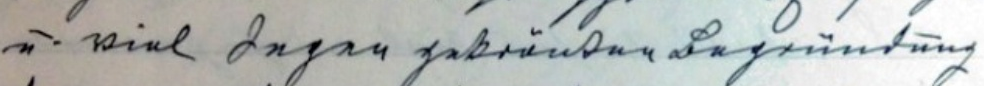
u. viel Segen gekrönten Begründung
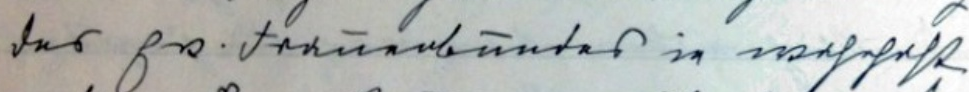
des Ev. Frauenbundes in wahrhaft
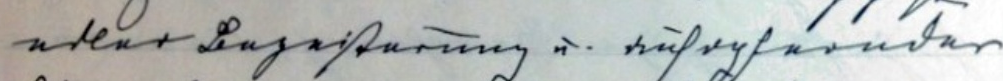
edler Begeisterung u. aufopfernder
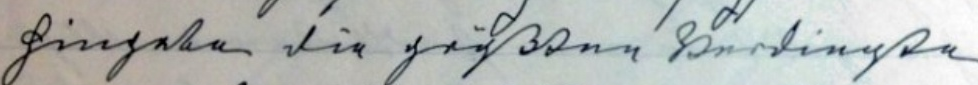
Hingabe die größten Verdienste
